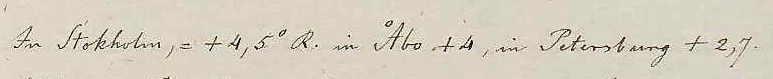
In Stokholm, +4,5° R. in Åbo +4, in Petersburg +2,7.
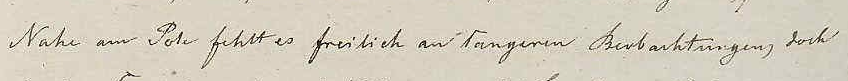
Nahe am Pole fehlt es freilich an längeren Beobachtungen, doch
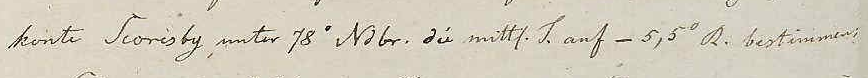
konte Scoresby unter 78° Ndbr. die mittl. T. auf −5,5° R. bestimmen;
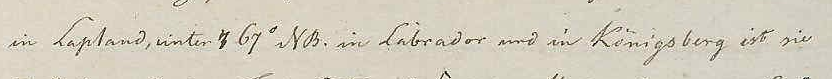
in Lapland, unter 767° NB. in Labrador und in Königsberg ist sie
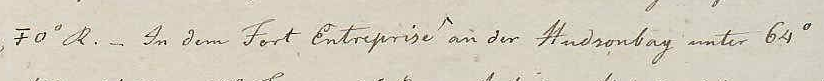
±0° R. – In dem Fort Entreprise an der Hudsonbay unter 64°
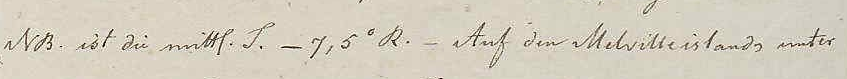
NB. ist die mittl. T. −7,5° R. – Auf den Melvilleislands unter
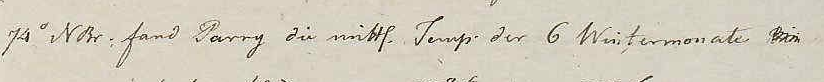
74° NBr. fand Parry die mittl. Temp. der 6 Wintermonate bei
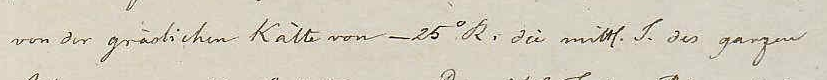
von der gräslichen Kälte von −25° R. die mittl. T. des ganzen
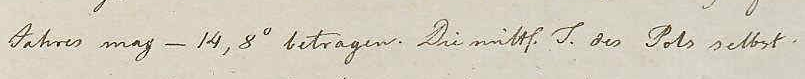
Jahres mag −14,8° betragen. Die mittl. T. des Pols selbst
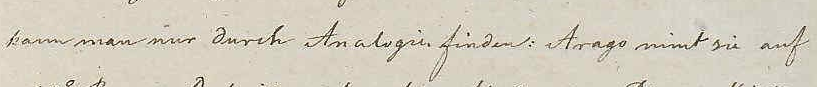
kann man nur durch Analogie finden: Arago nimt sie auf
